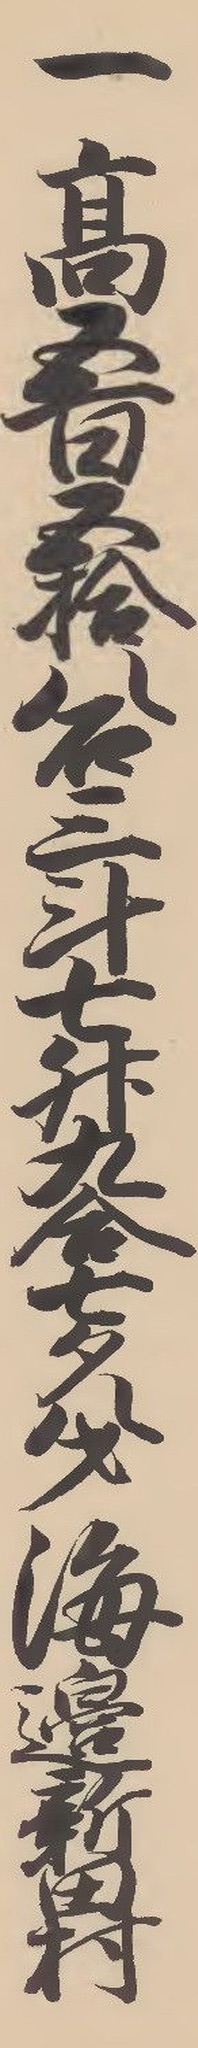一高五百五拾八石三斗七升九合七勺八才海邉新田村
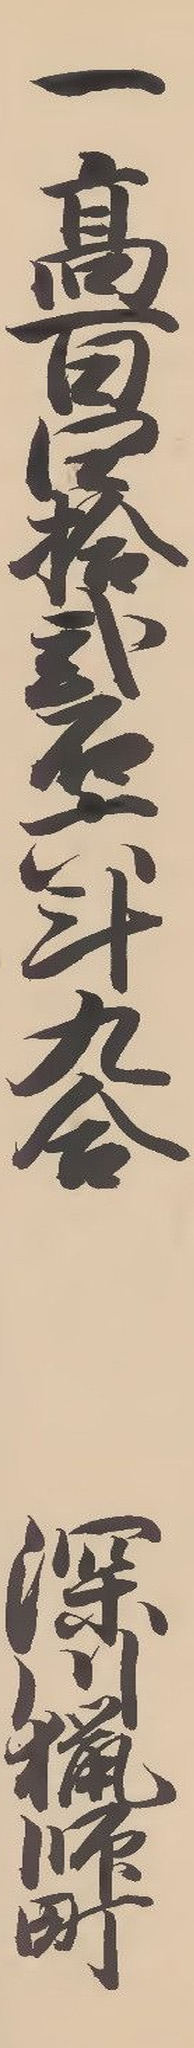一高百四拾弐石六斗九合深川猟師町
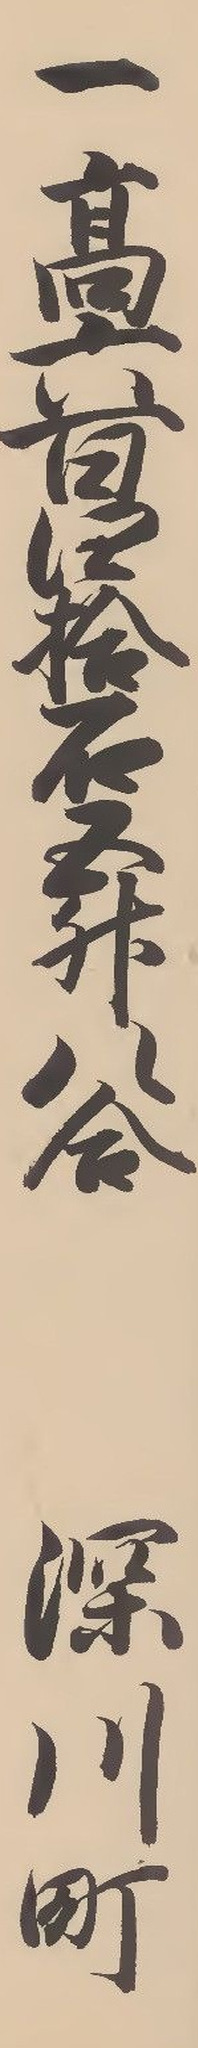一高六百四拾石五升八合深川町
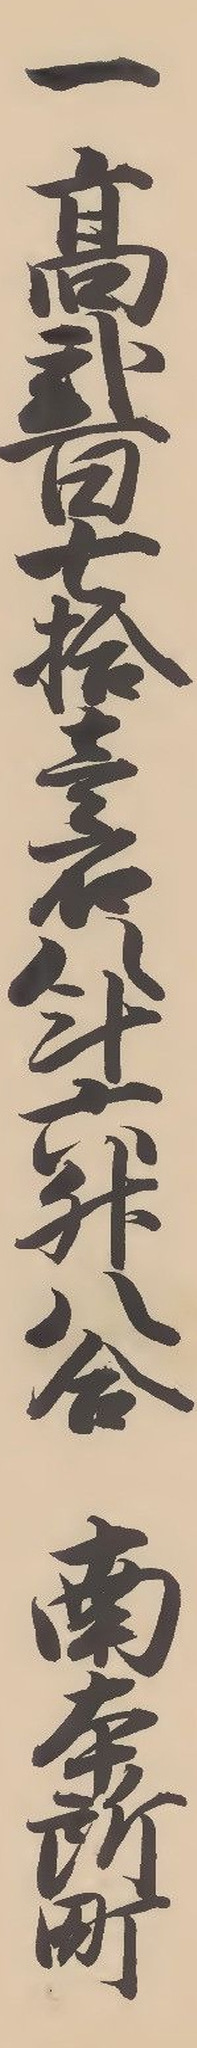一高弐百七拾壱石八斗六升八合南本所町
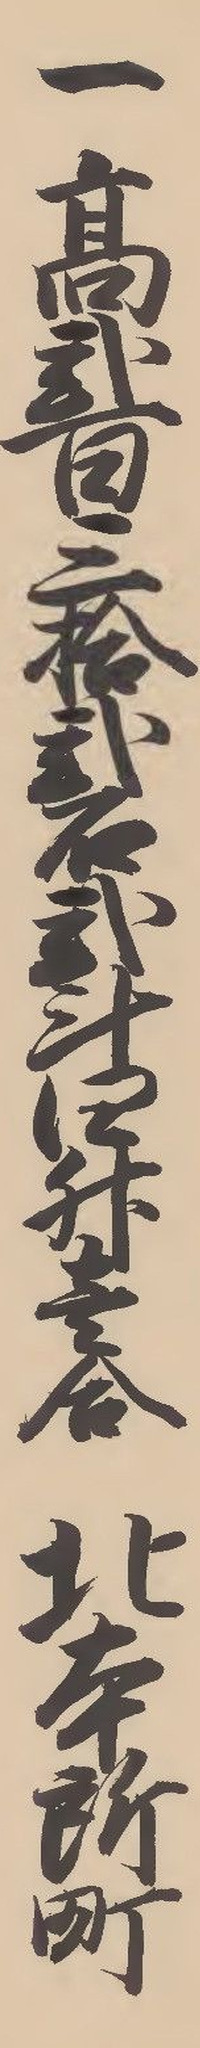一高弐百三拾弐石弐斗四升壱合北本所町
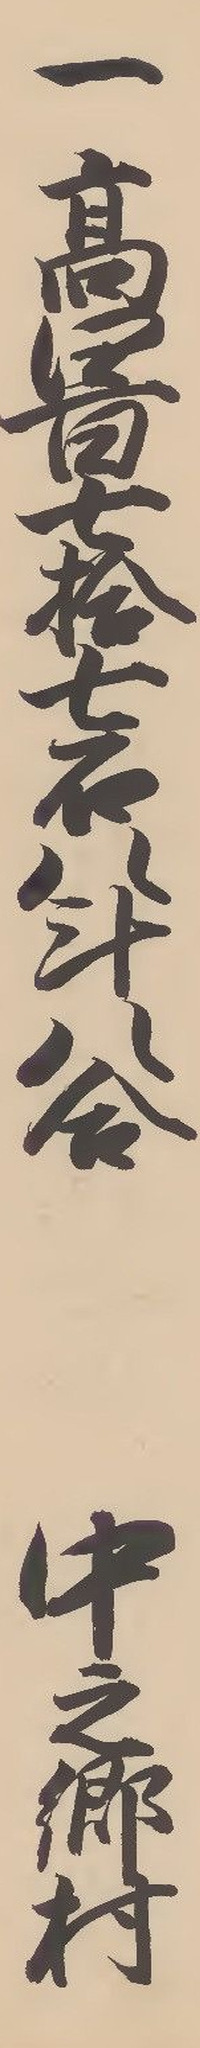一高四百七拾七石八斗八合中之郷村

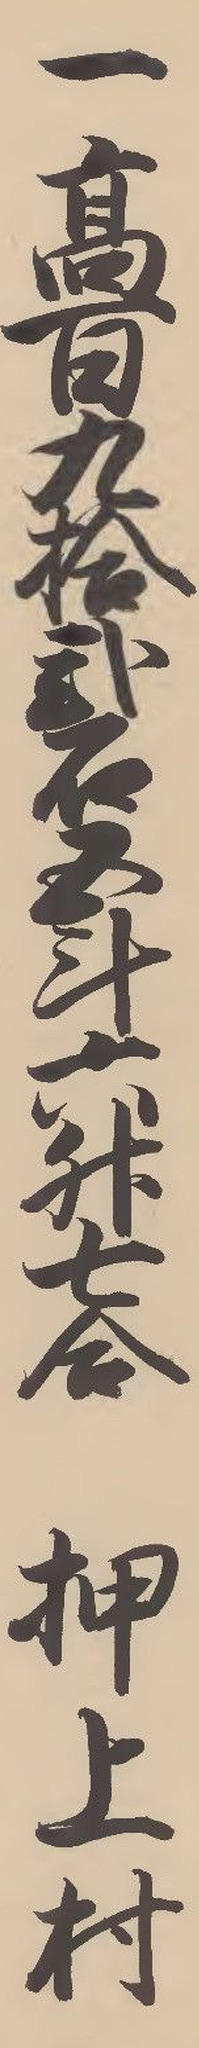一高百九拾弐石五斗六升七合押上村
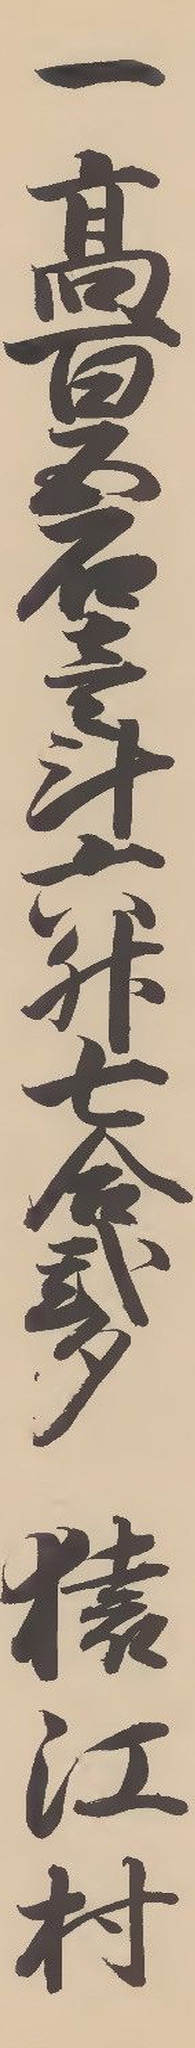一高百五石壱斗六升七合弐勺猿江村
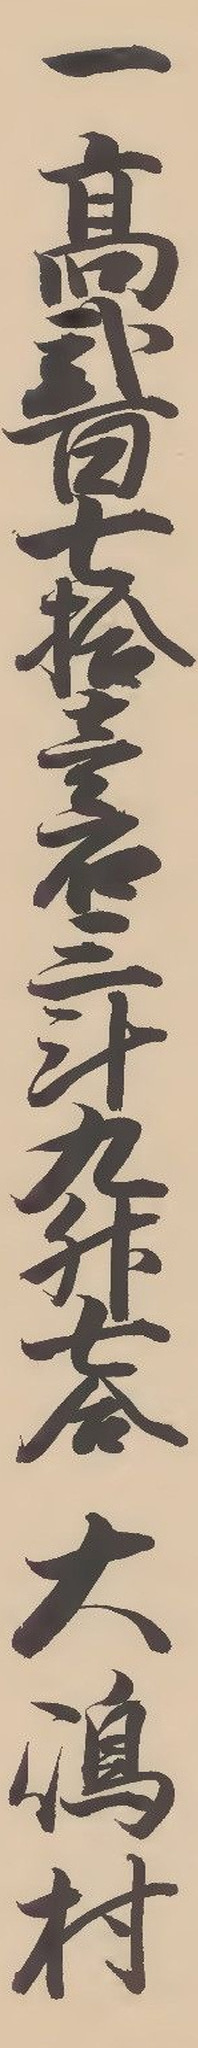一高弐百七拾壱石三斗九升七合大嶋村
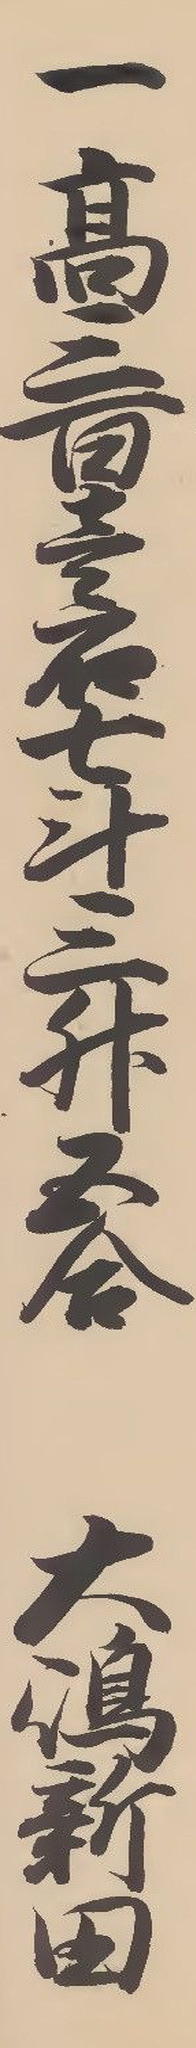一高三百壱石七斗三升五合大嶋新田
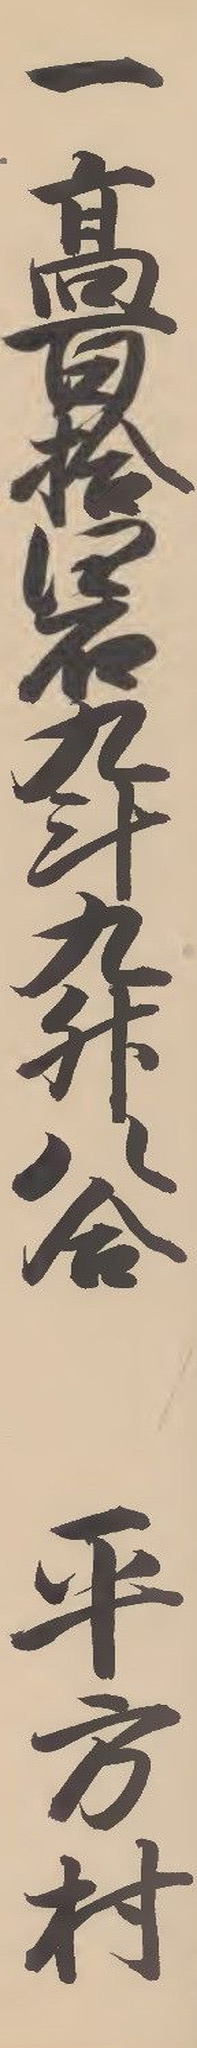一高百拾四石九斗九升八合平方村
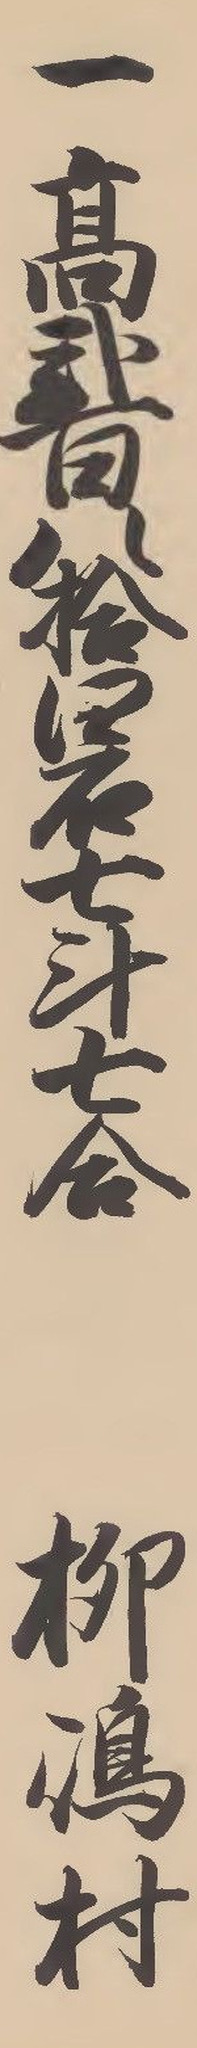一高弐百八拾四石七斗七合柳嶋村
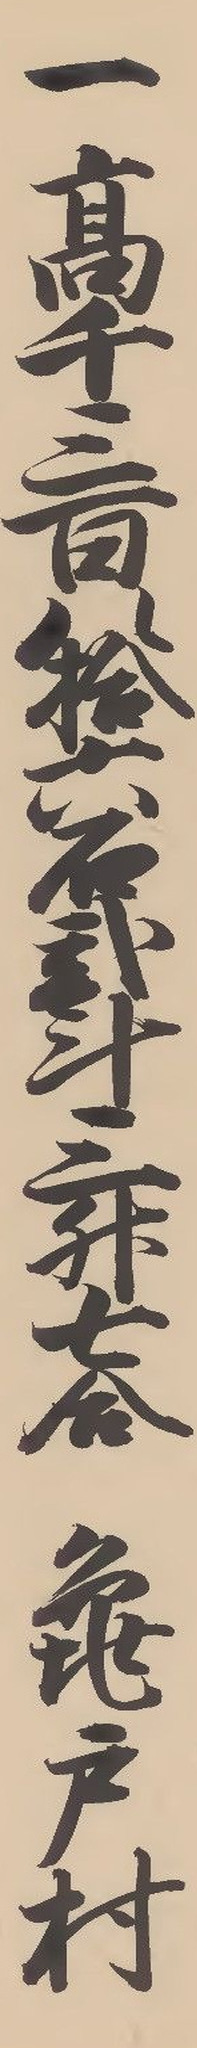一高千三百八拾六石弐斗三升七合亀戸村
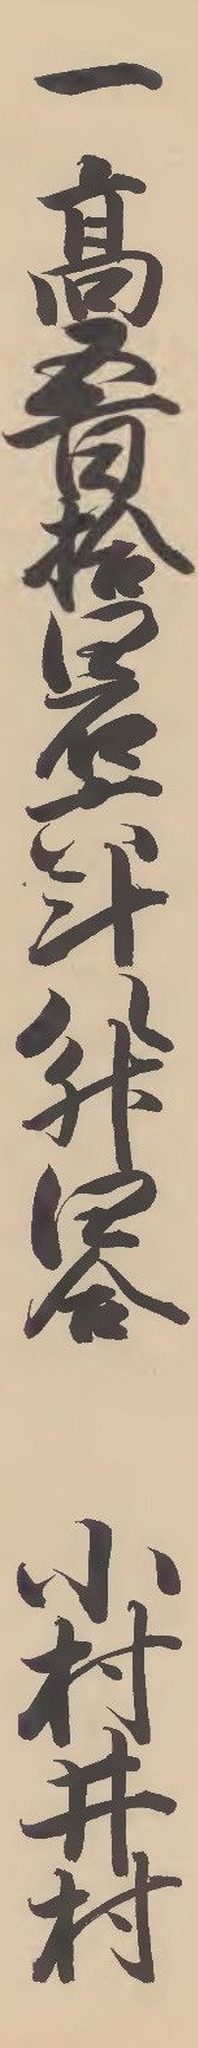一高五百拾四石六斗八升四合小村井村

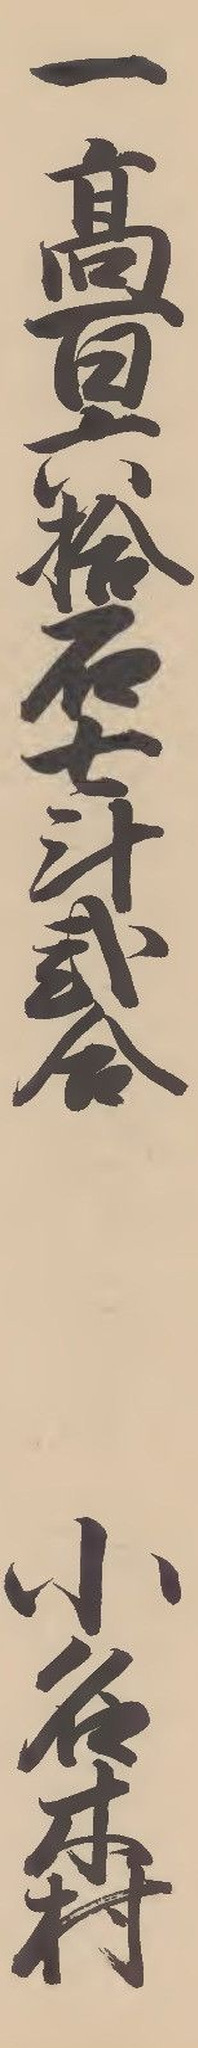一高百六拾石七斗弐合小名木村
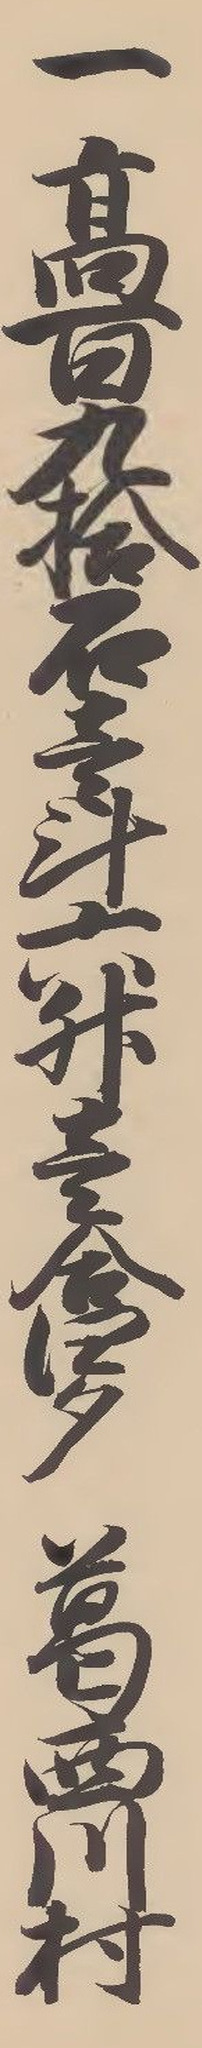一高百九拾石壱斗六升壱合四勺葛西川村
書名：武蔵国郷帳　下
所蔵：国立公文書館 National Archives of Japan
